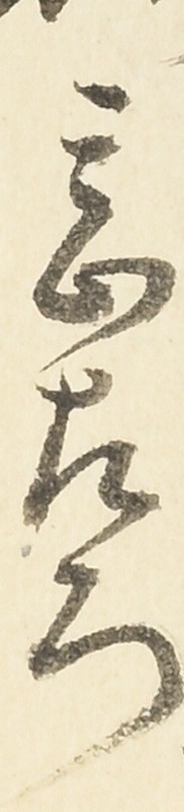甚左衛門
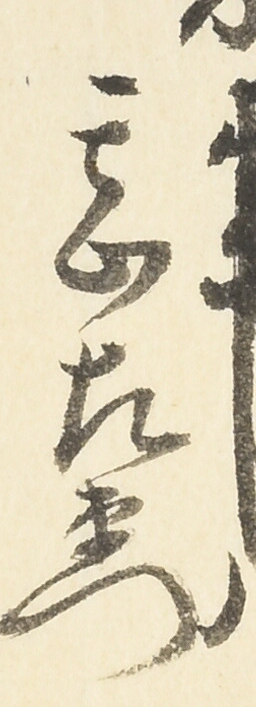甚左衛門
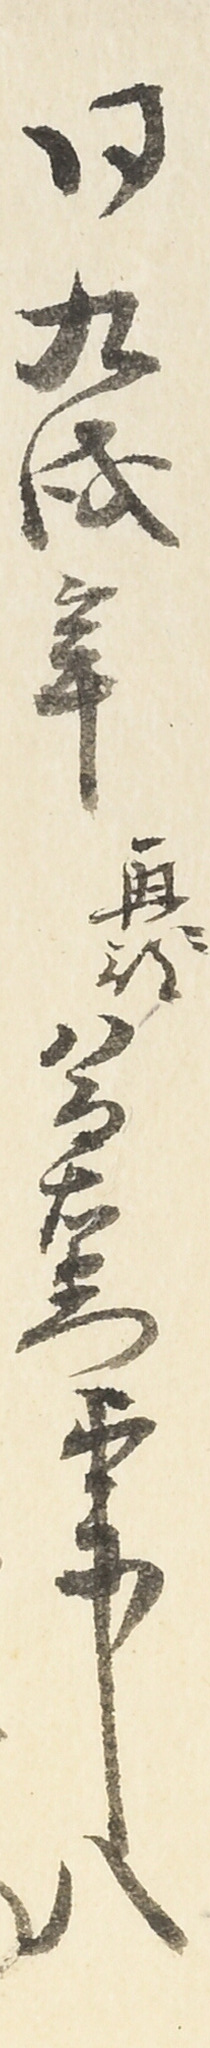同九戌年再役八百右衛門宗八
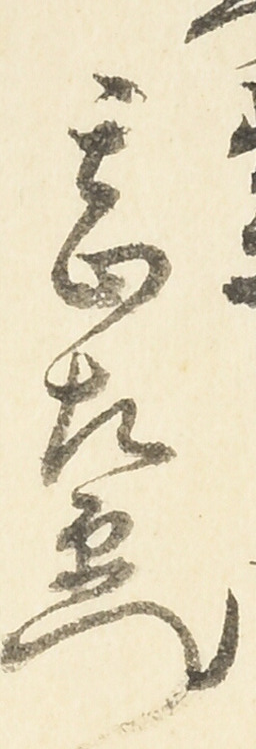甚左衛門
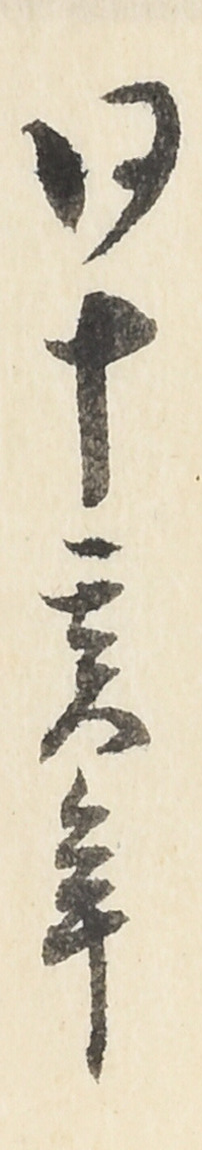同十亥年
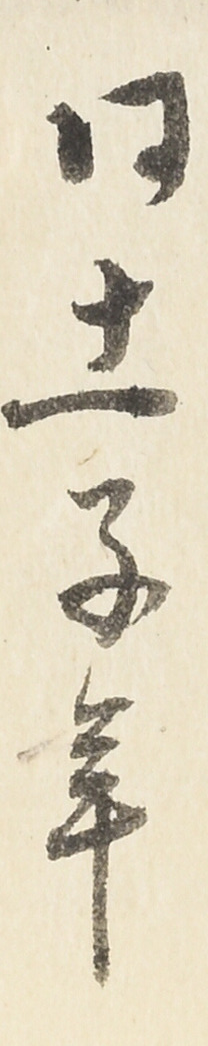同十一子年
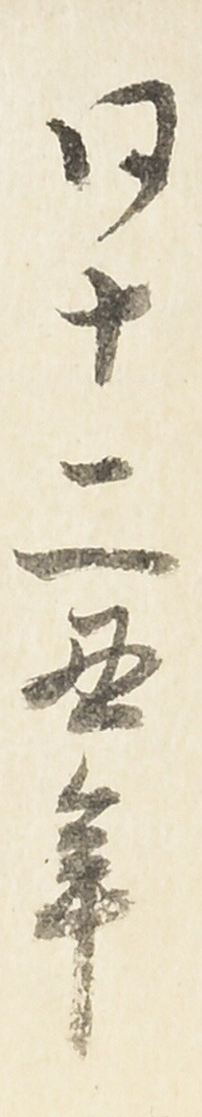同十二丑年
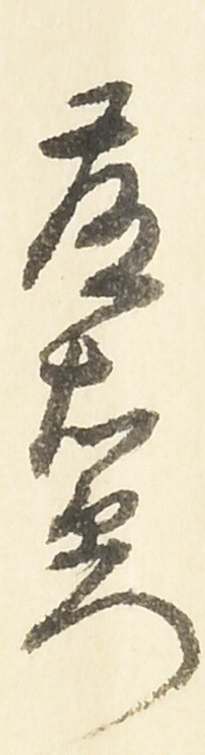藤左衛門
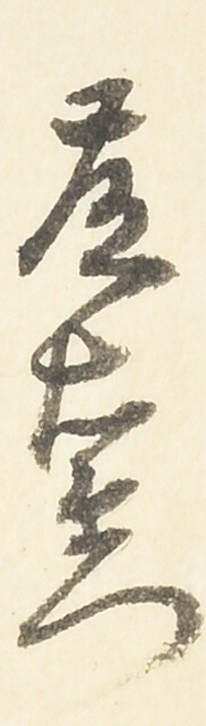藤左衛門
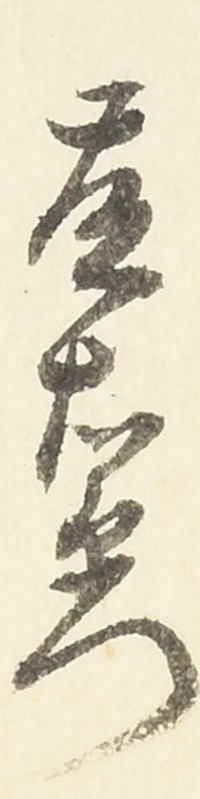藤左衛門

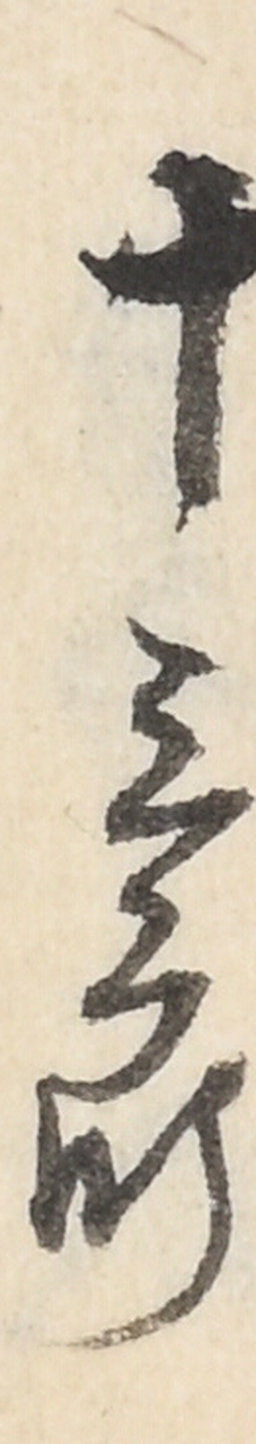十三郎
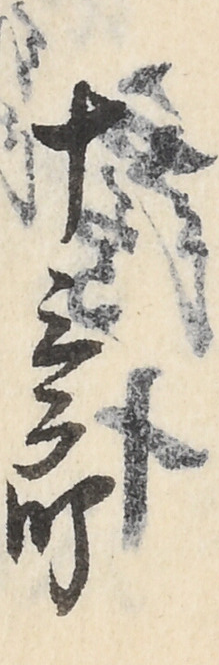十三郎
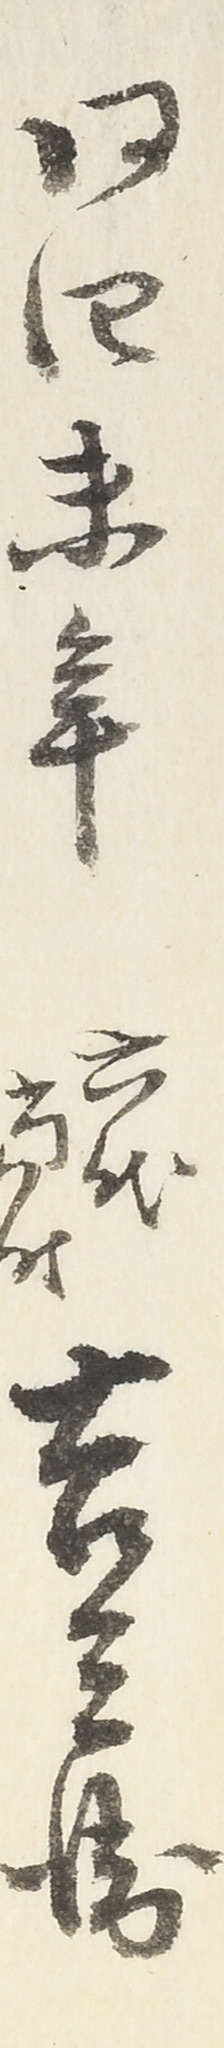同四未年六代吉兵衛
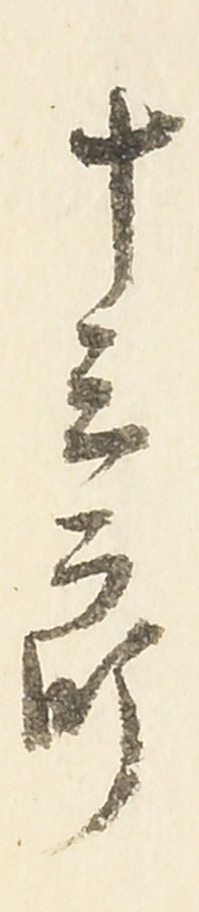十三郎
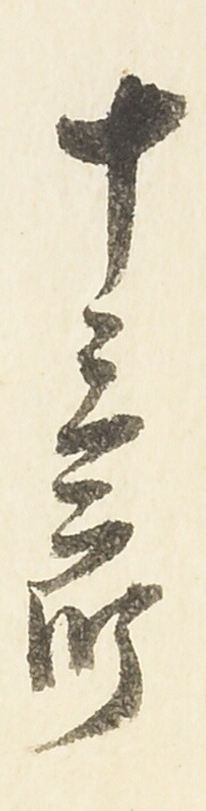十三郎
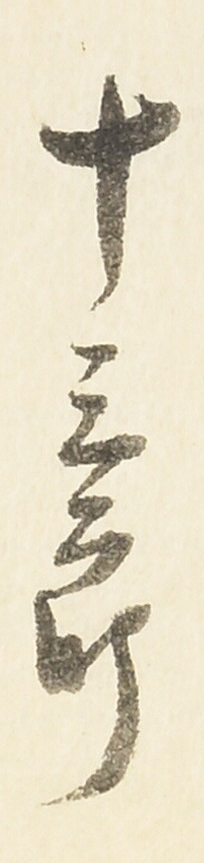十三郎
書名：鉾持町丁代勤役年歴順控
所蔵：伊那市立高遠町図書館・合同会社AMANE
